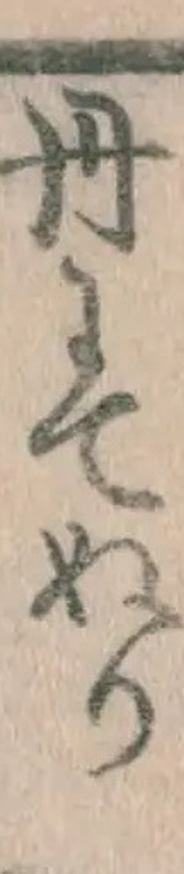丹にてぬり
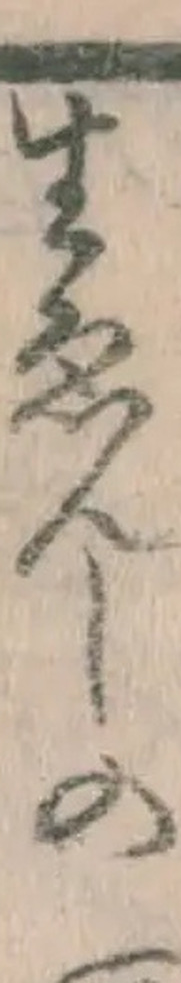生ゑんしの
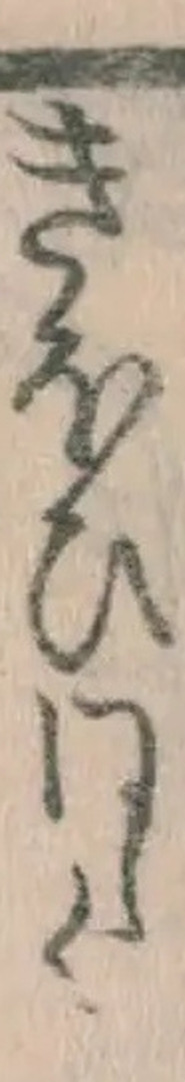きほひ同しく
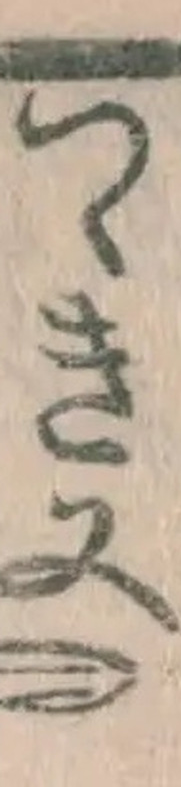つゝき又
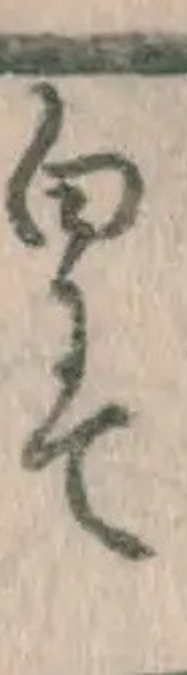白にて
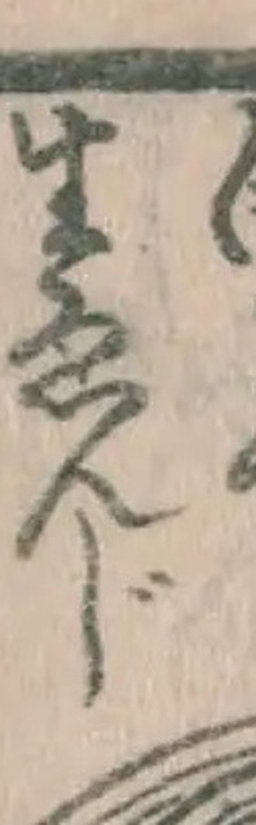生ゑんじ
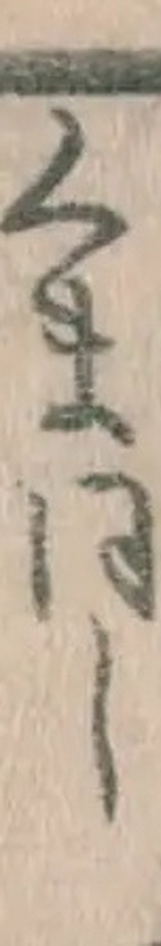くま同し
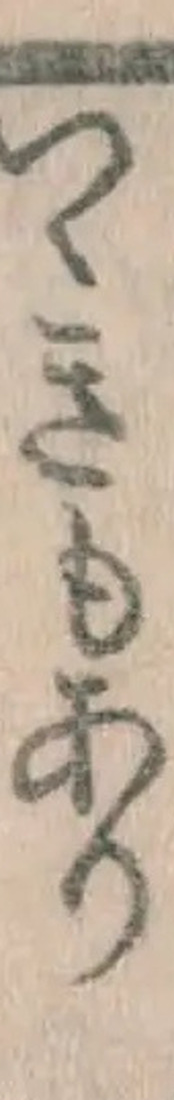つゝきもあり
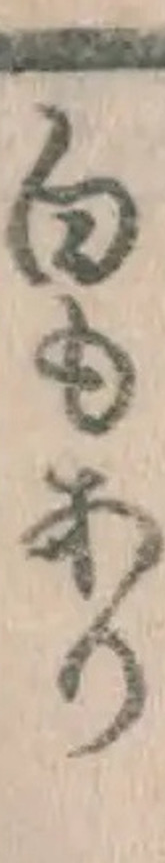白もあり
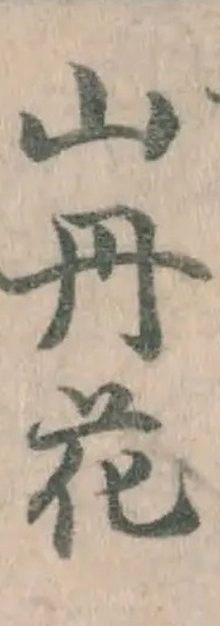山丹花

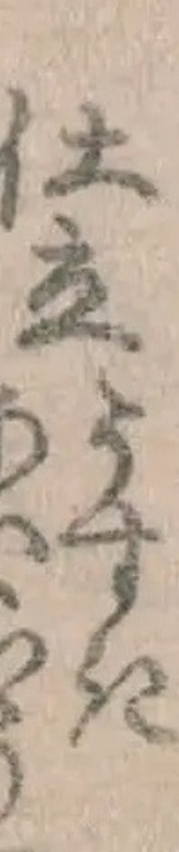仕立うすき
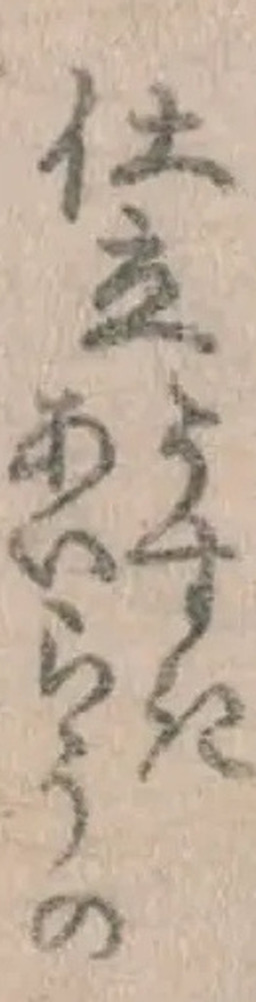あいらうの
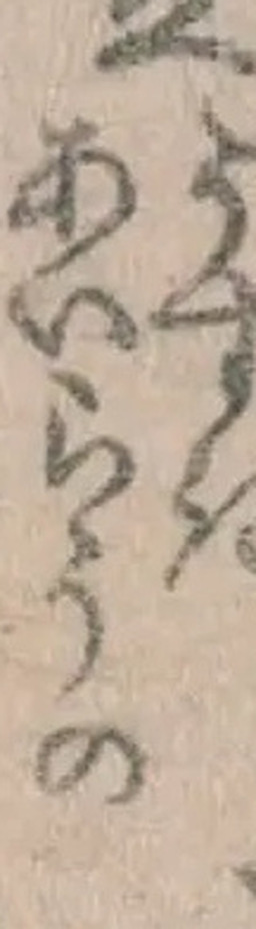あいらうの
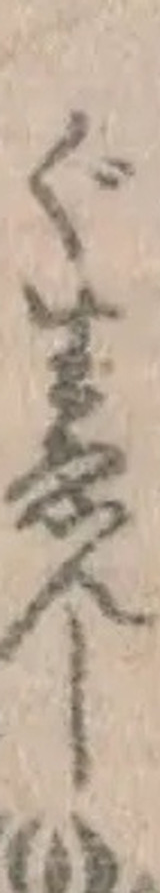ぐ生ゑんし
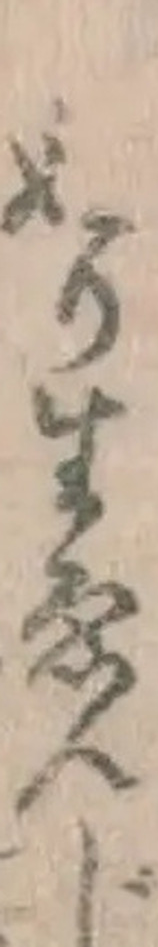ぬり生ゑんじ
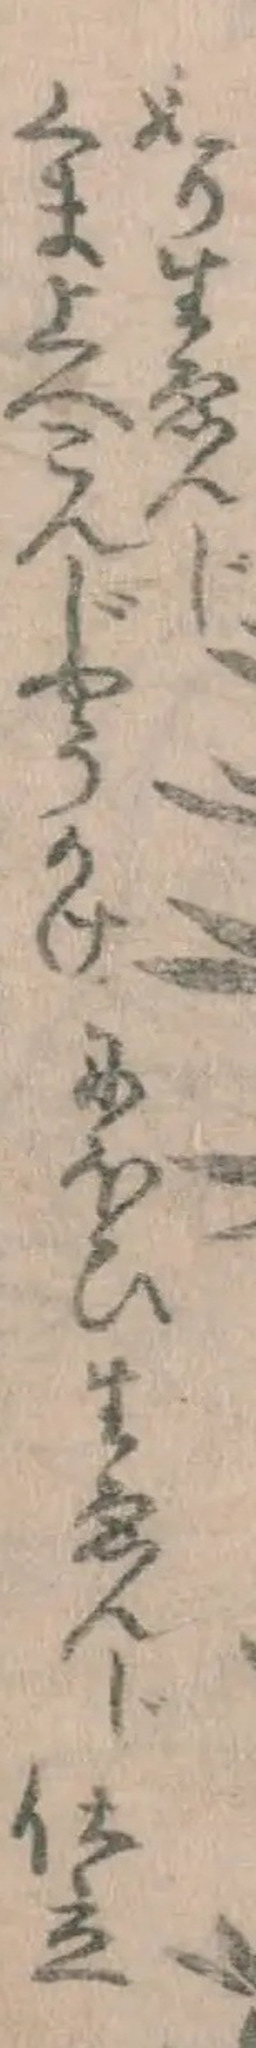くま上へこんじやうかけにほひ生ゑんじ仕立
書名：絵本時津艸
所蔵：国立国会図書館 National Diet Library, JAPAN
